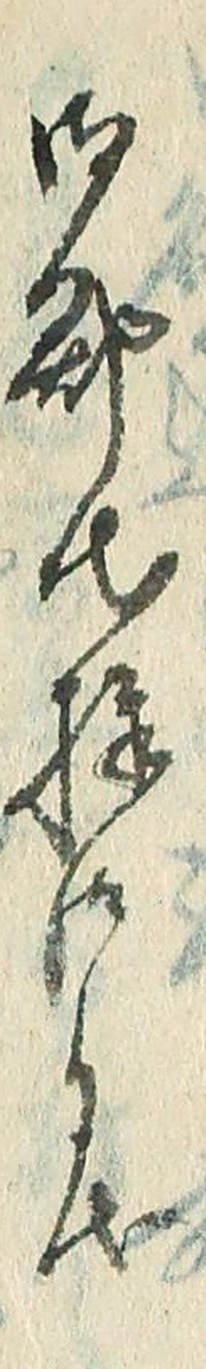御郡代様御手代
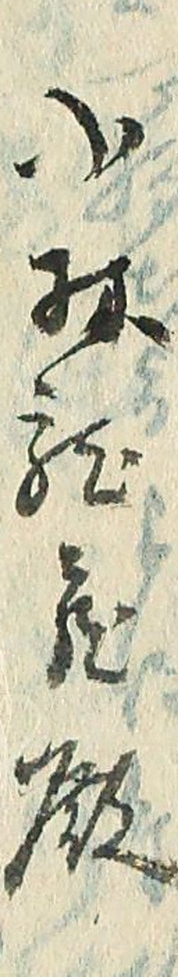小林龍蔵殿
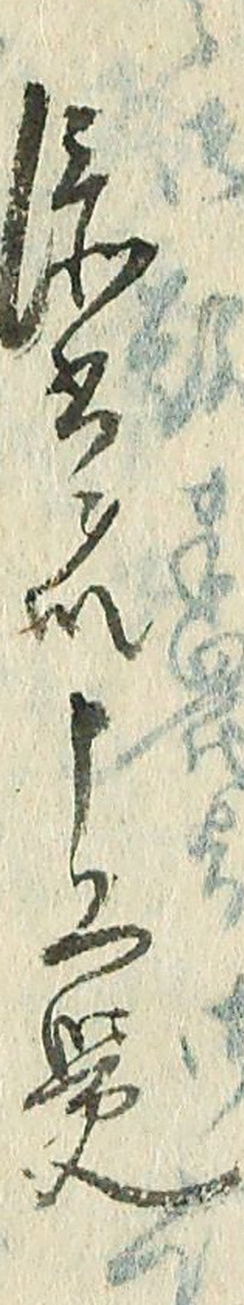添書を以申上覚
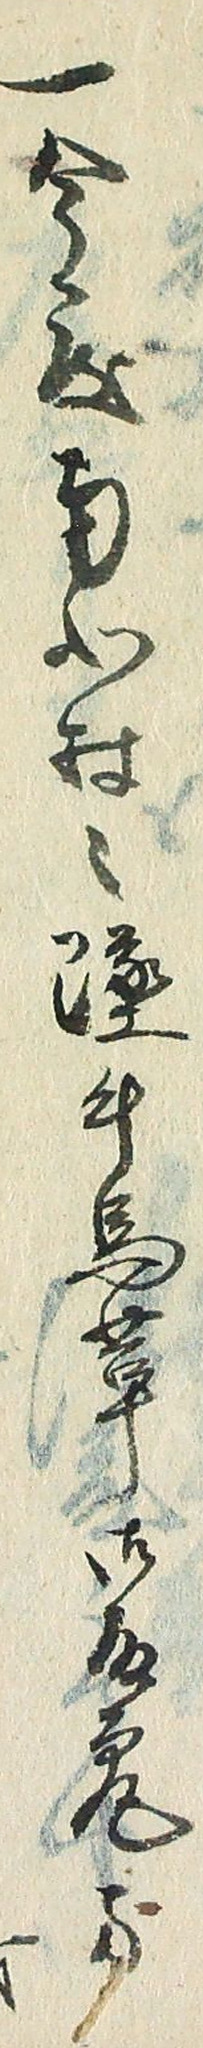一今度南北村々墜牛馬革御取究方
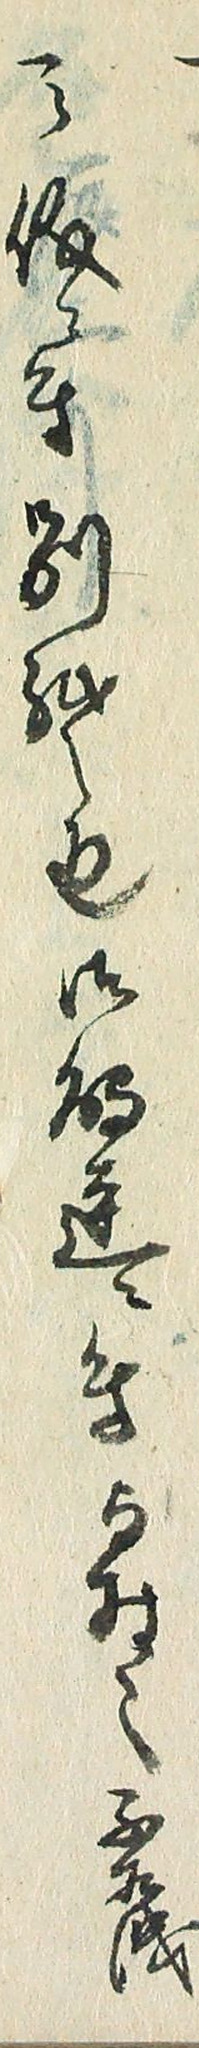之儀に付別紙之通御触達に付与村々不相洩
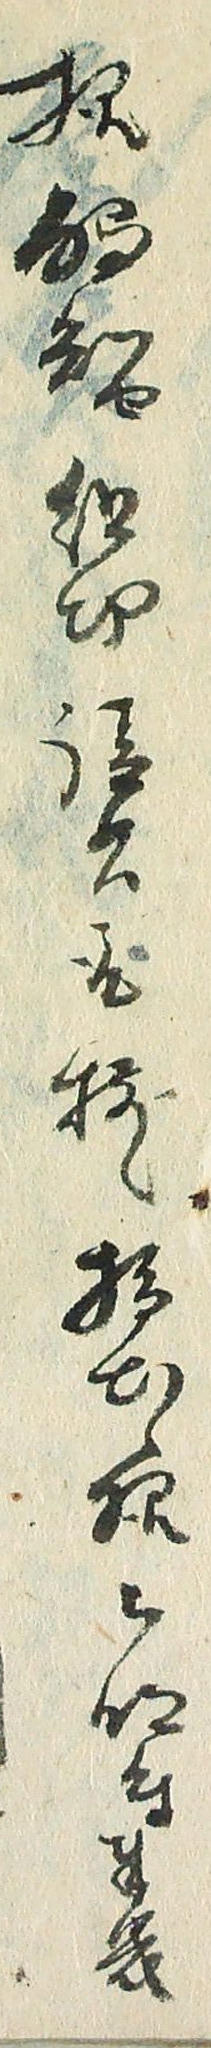様触知せ組切請書取揃へ指出候様被仰付奉畏
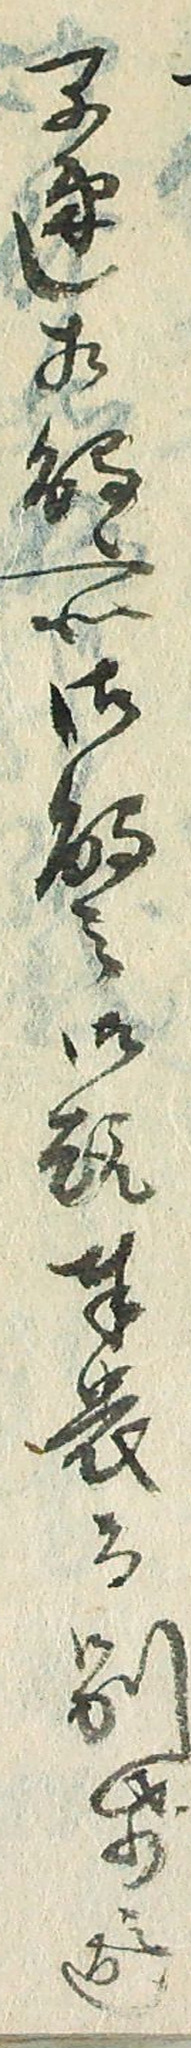早速相触候所御触之御趣奉畏旨別帋之通
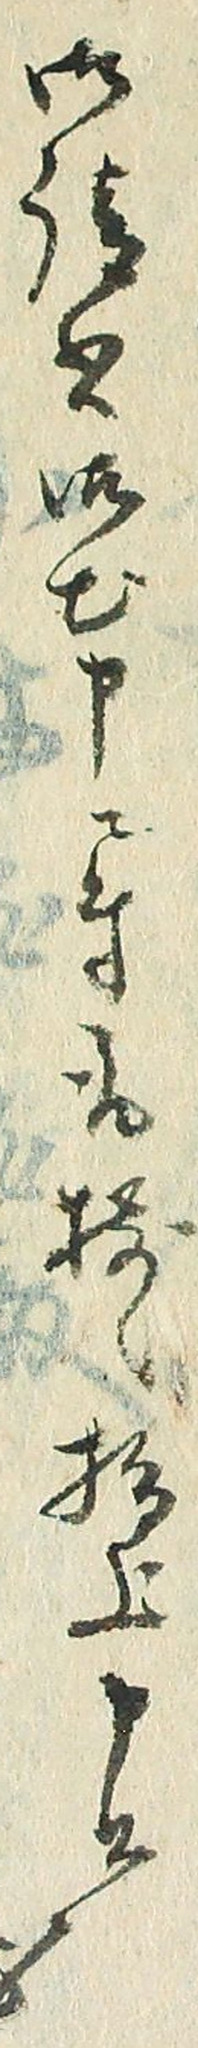御請書御出申に付取揃へ指上申候以上
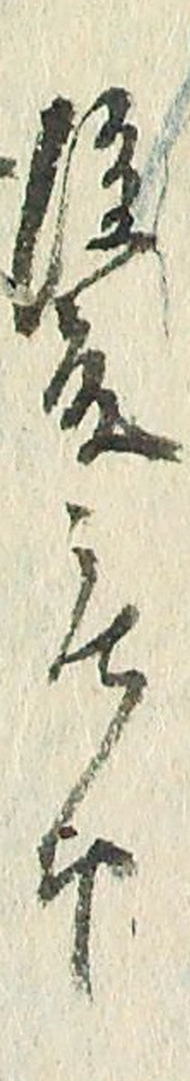後藤庄助
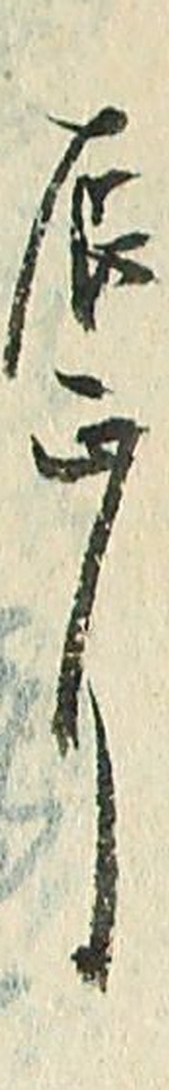辰正月
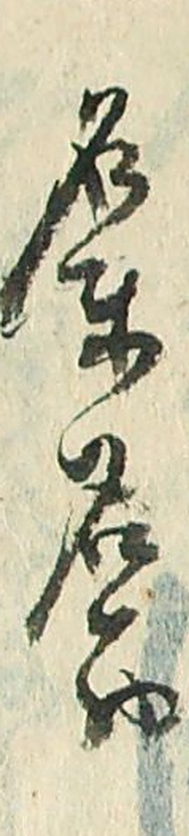名東名西
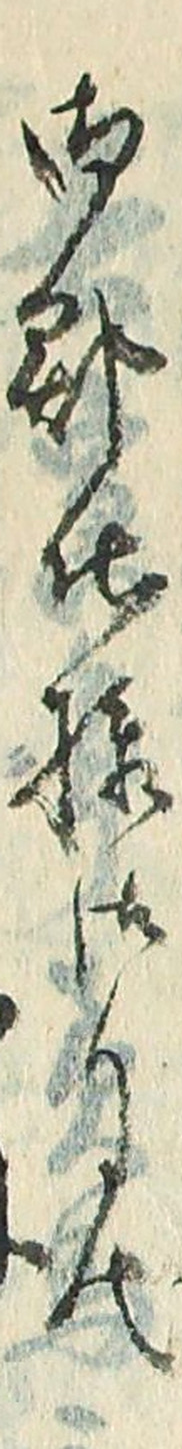御郡代様御手代
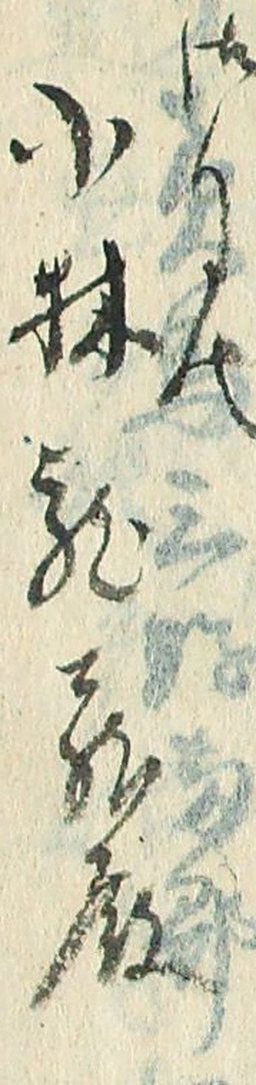小林龍蔵殿

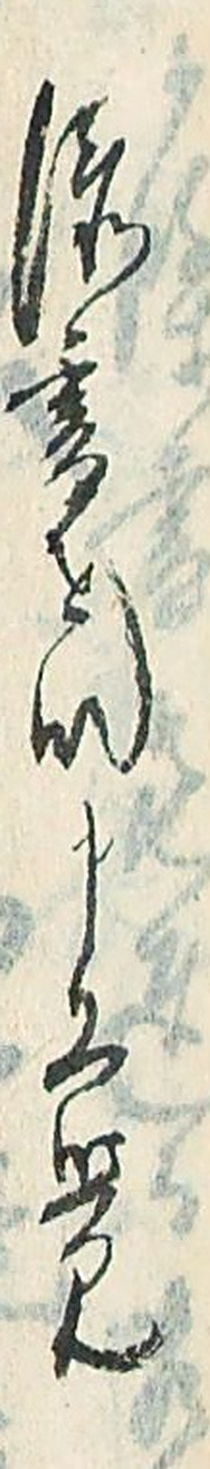添書を以申上覚
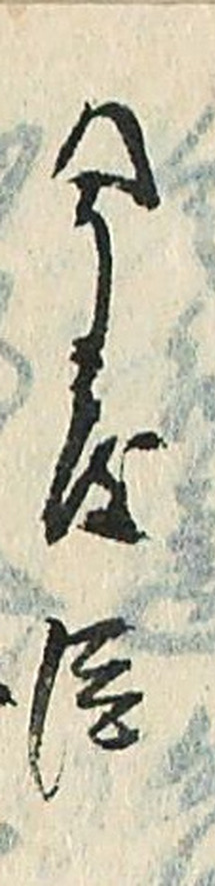今度従
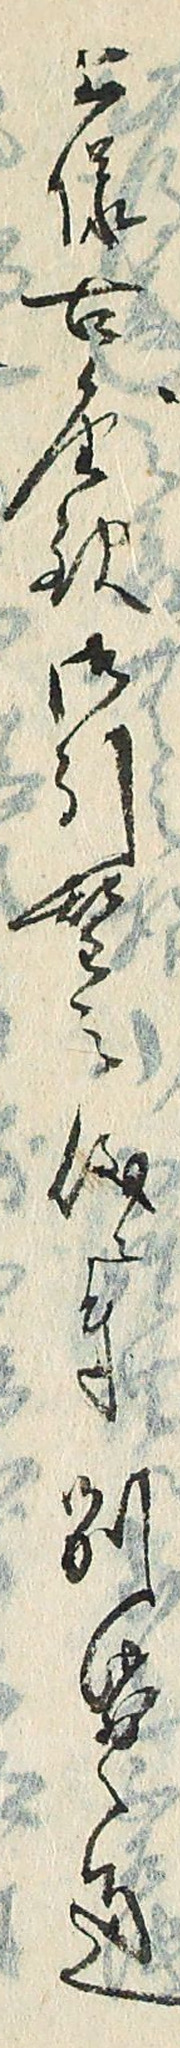公儀古金銀御引替之儀に付別帋之通
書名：諸御用御□受書控
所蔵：鳴門教育大学 Naruto University of Education
